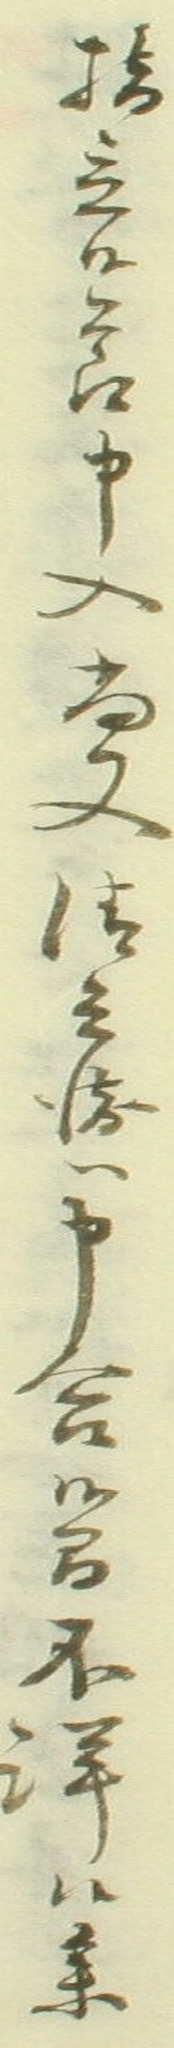指立候節申入尚又清兵衛へ申合候間不詳候参
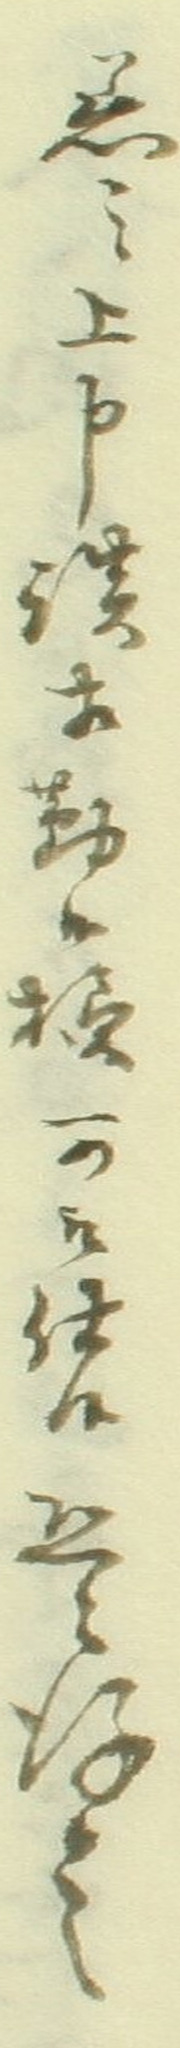着之上申談相勤候様可被仕候恐々謹言
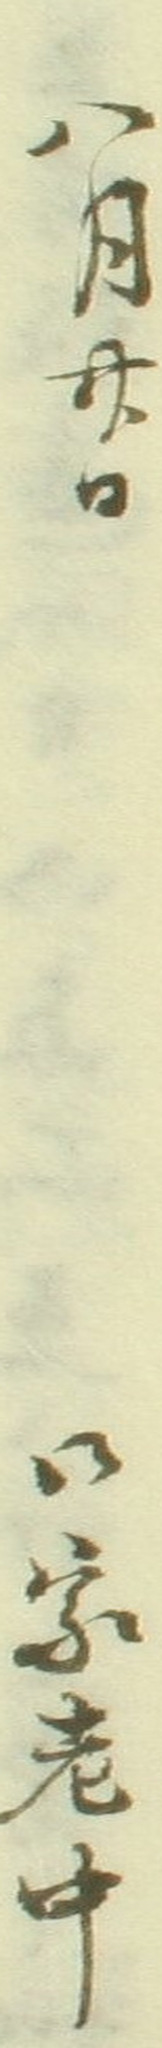八月廿日御家老中
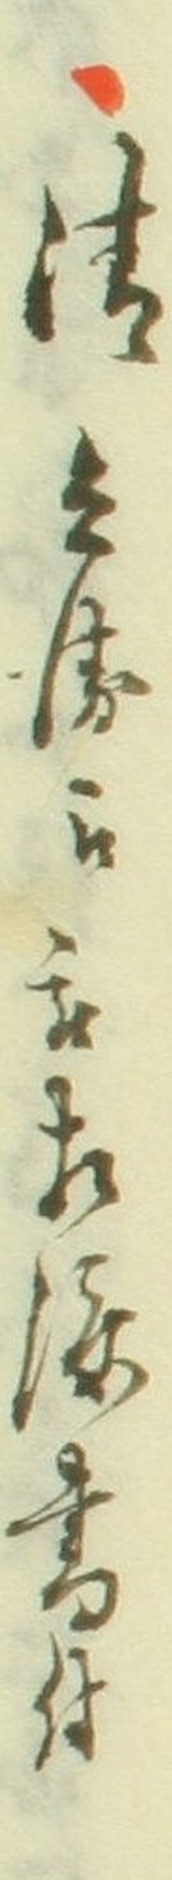清兵衛え被相渡書付

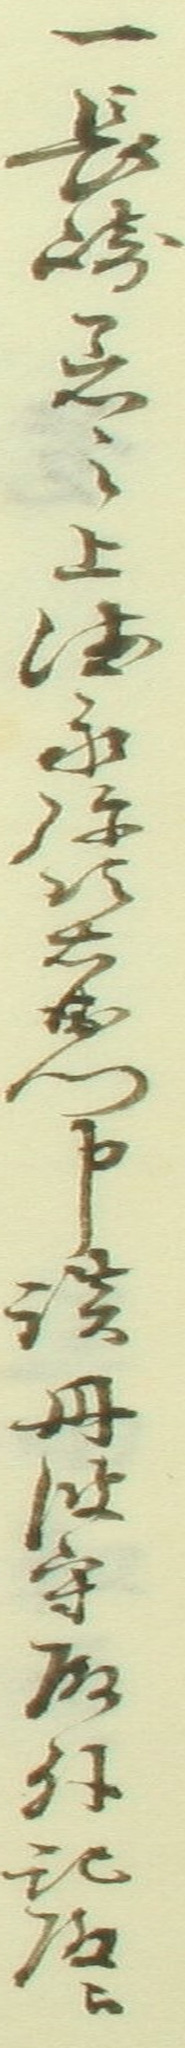一長崎着之上徳永弥次右衛門申談丹波守殿外記殿え
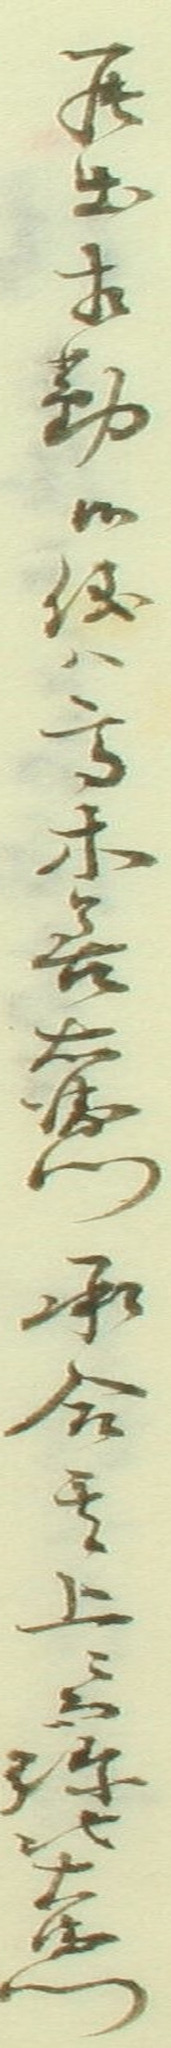罷出相勤候儀は高木善右衛門承合其上に而弥次右衛門
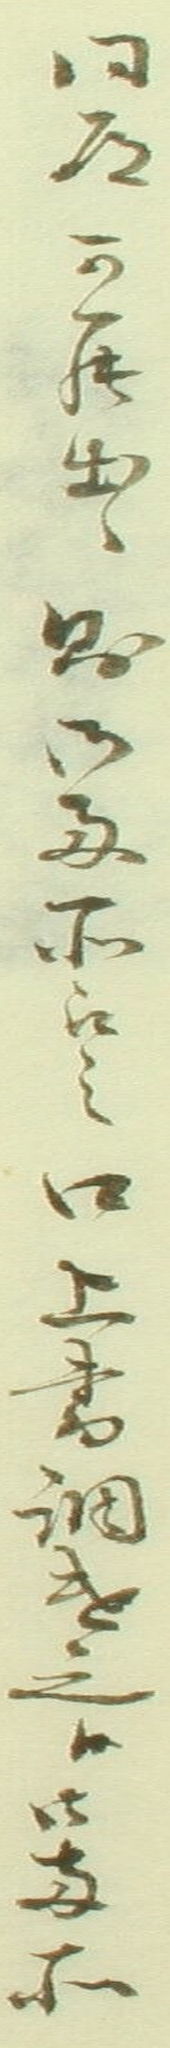同道可罷出候則御両所え之口上書調遣之候御両所
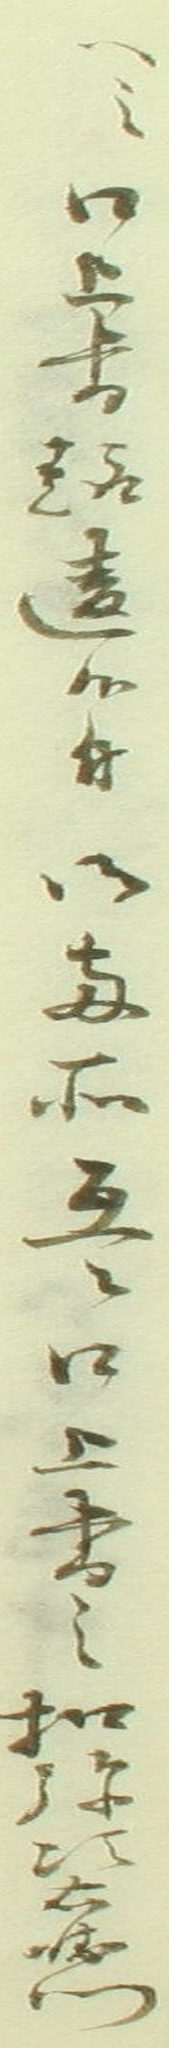へ之口上書趣違候付御両所互に口上書之扣弥次右衛門
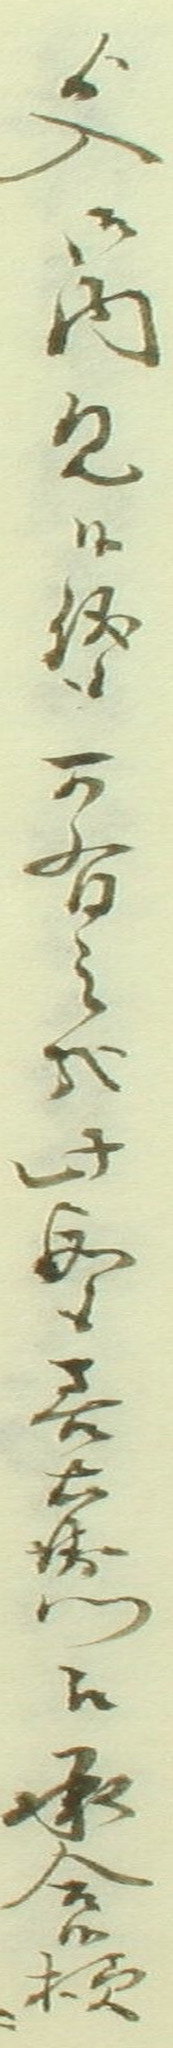ゟ入御内見候儀も可有之哉此段も善右衛門え承合候様に
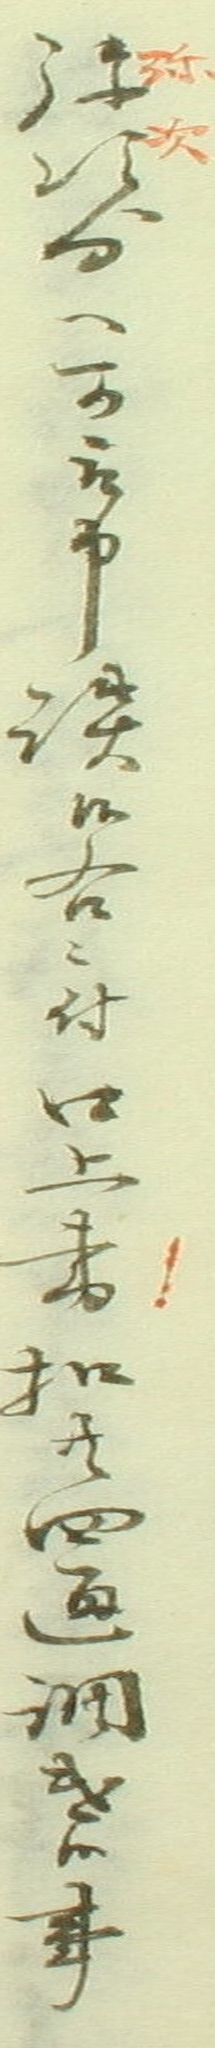弥次右衛門へ可被申談候右に付口上書扣共四通調遣候事
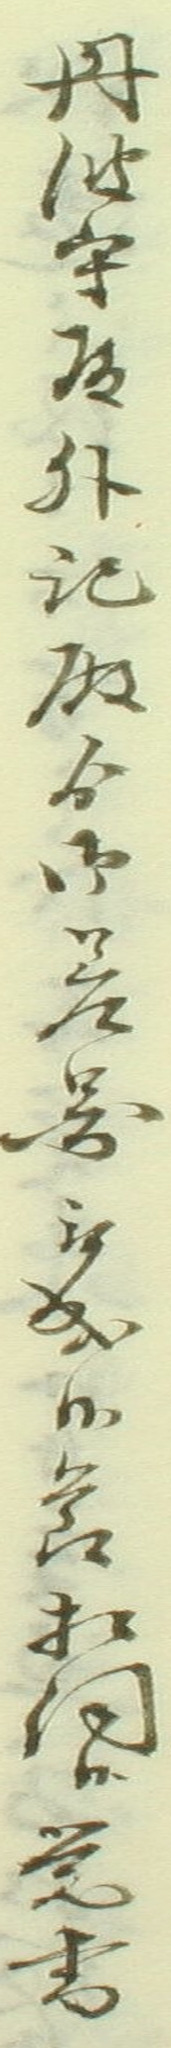丹波守殿外記殿ゟ御差図被成候節相伺候覚書
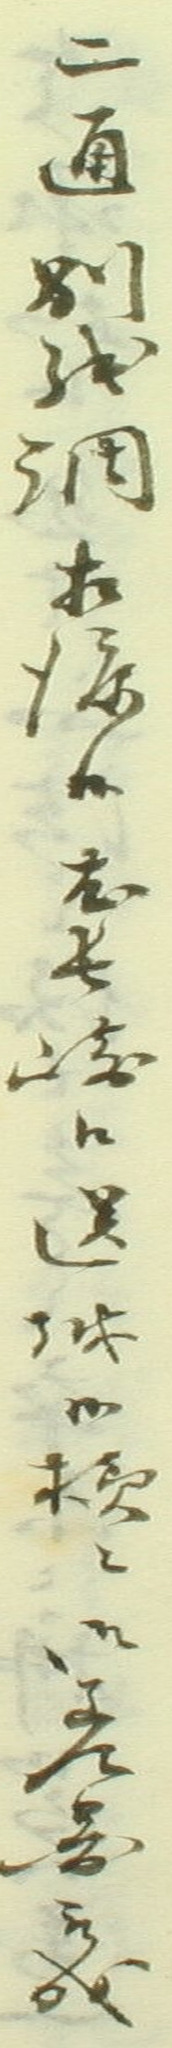二通別紙調相渡候尤長崎え送越候様に御差図被成
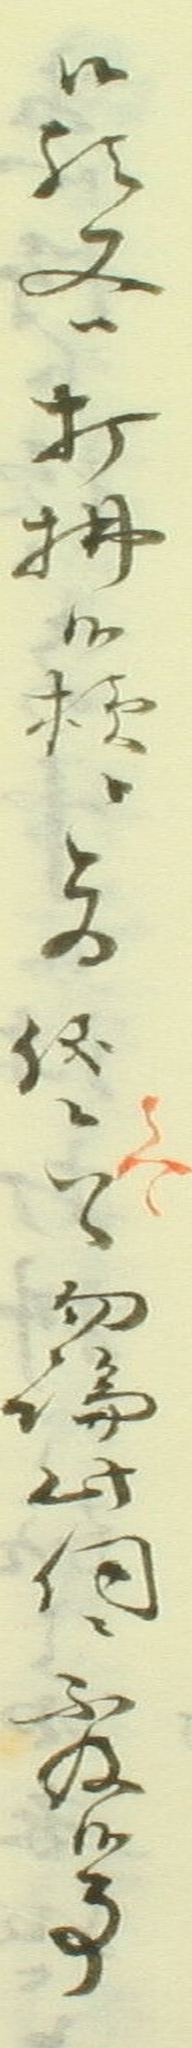候歟又は打払候様にと為儀候はゝ勿論此伺に不及候事
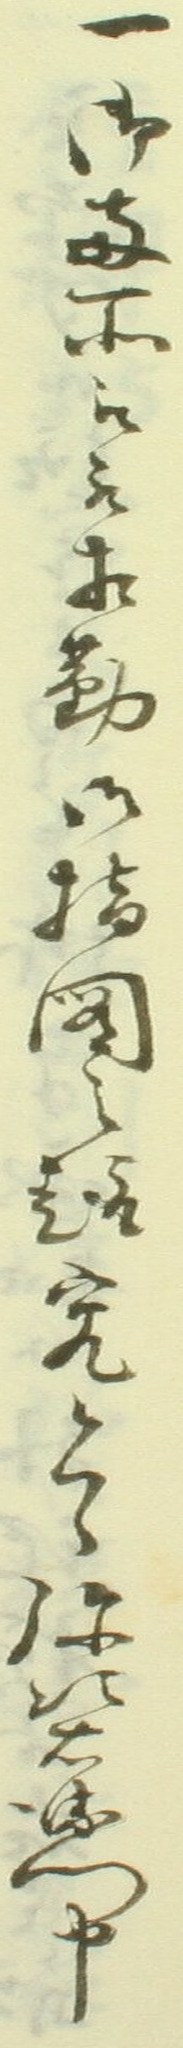一御両所え被相勤御指図之趣究候はゝ弥次右衛門申
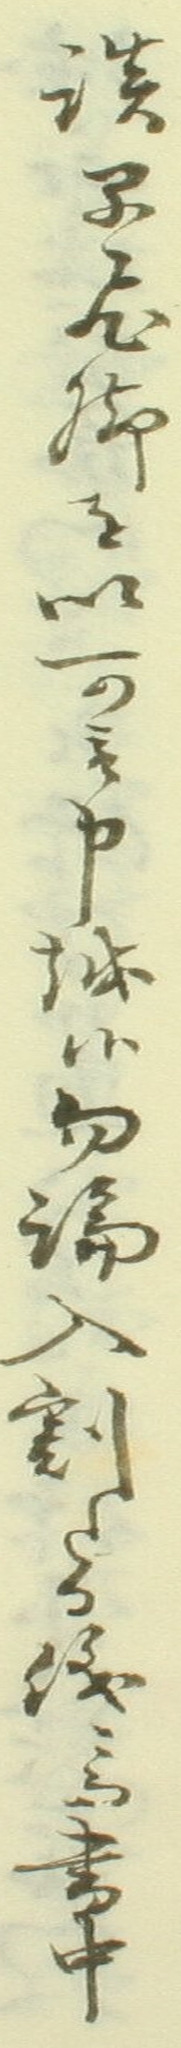談早飛脚を以可被申越候勿論入割たる儀に而書中
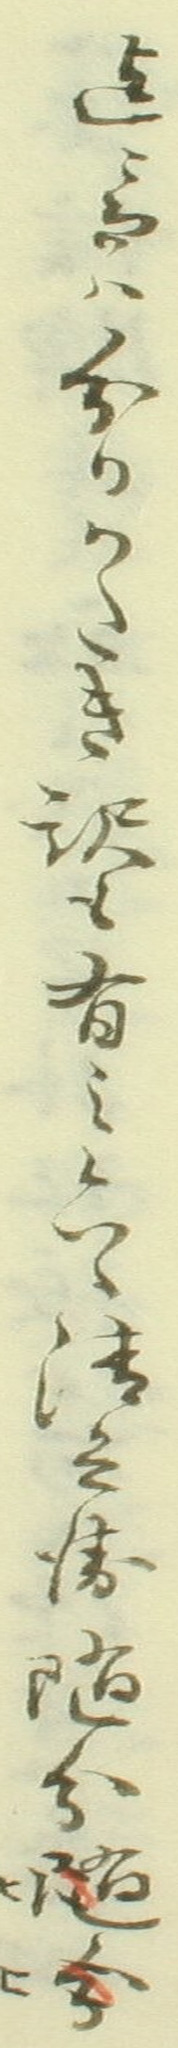迄に而は分りかたき訳も有之候はゝ清兵衛随分随分
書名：異国船漂着記
